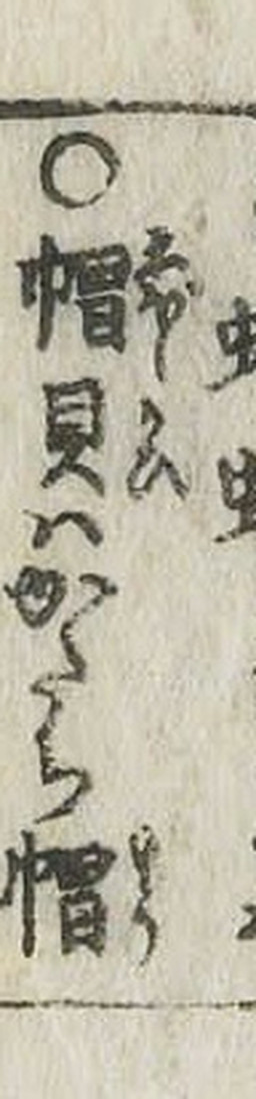○帽貝はかたち帽
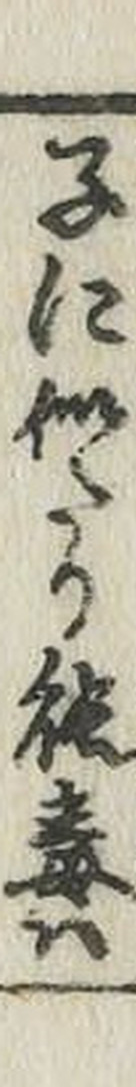子に似たり能毒は
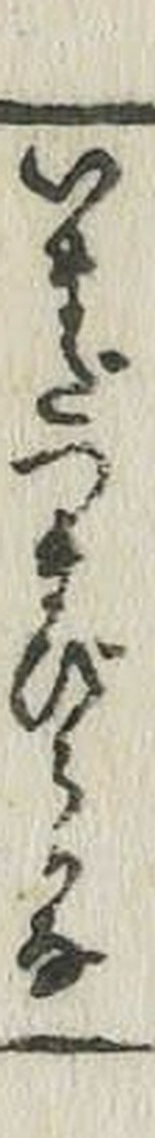いまだつまびらかな
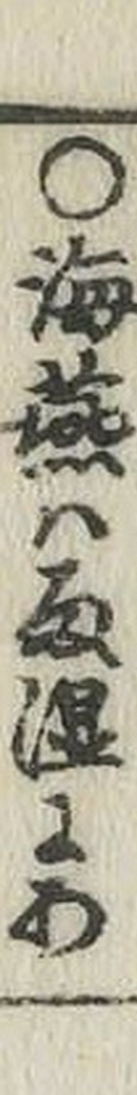○海燕は雨湿にあ
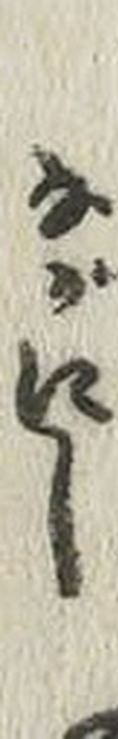ながにし
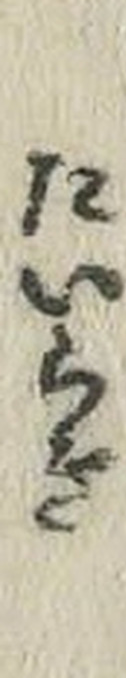たいらぎ

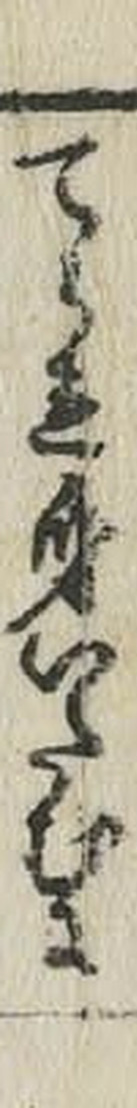てられ身いたむに
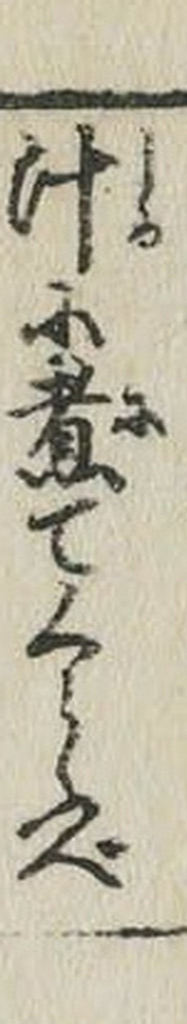汁に煮てくらふべ
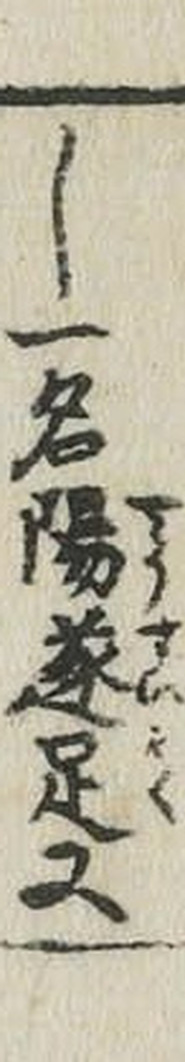し一名陽遂足又
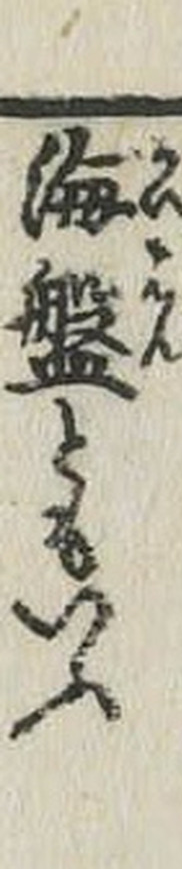海盤ともいふ
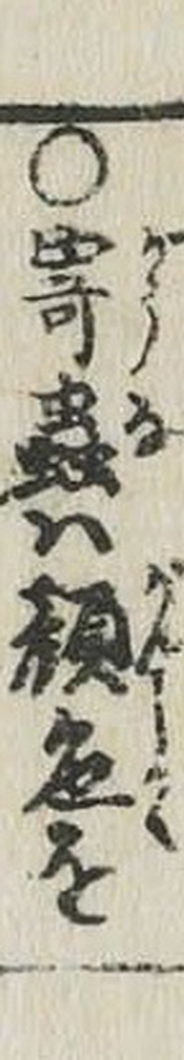○寄虫は顔色を
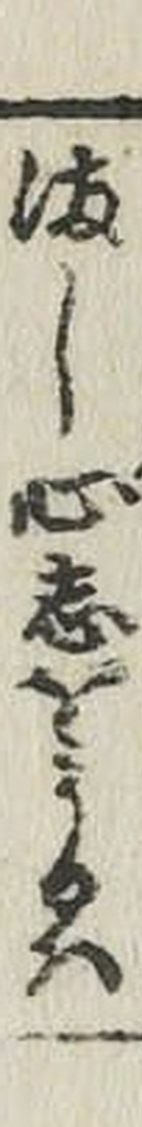まし心志をうるは
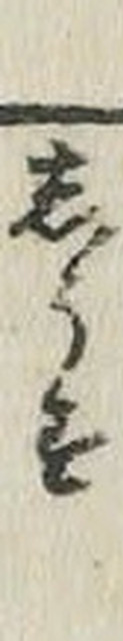しうす
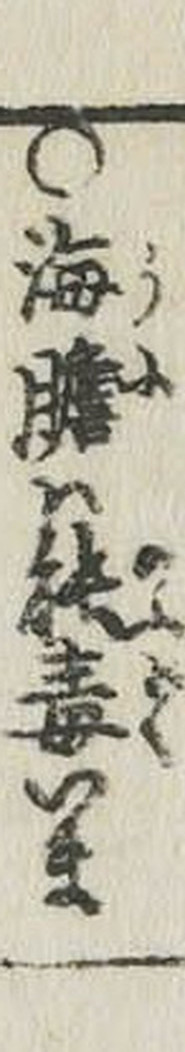○海胆は能毒いま
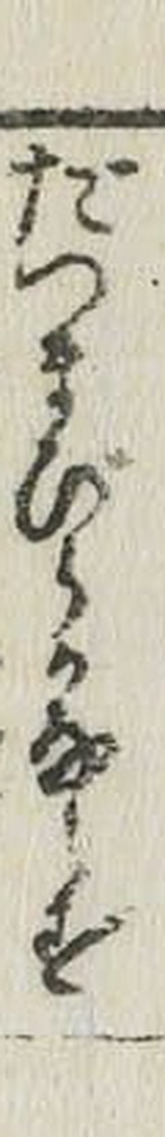だつまびらかならず
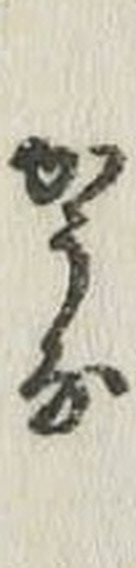かうな
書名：増補頭書訓蒙図彙大成 10巻 7:巻之14-16
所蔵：東京学芸大学教育コンテンツアーカイブ
